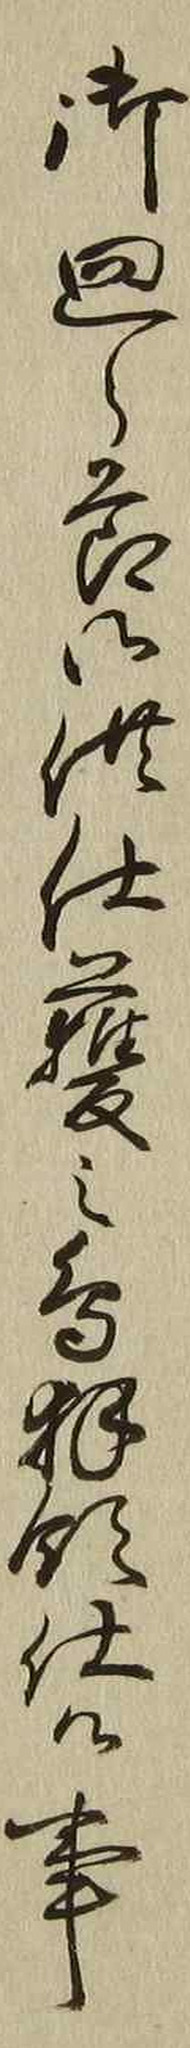御廻之節御供仕獲之鳥拝領仕候事
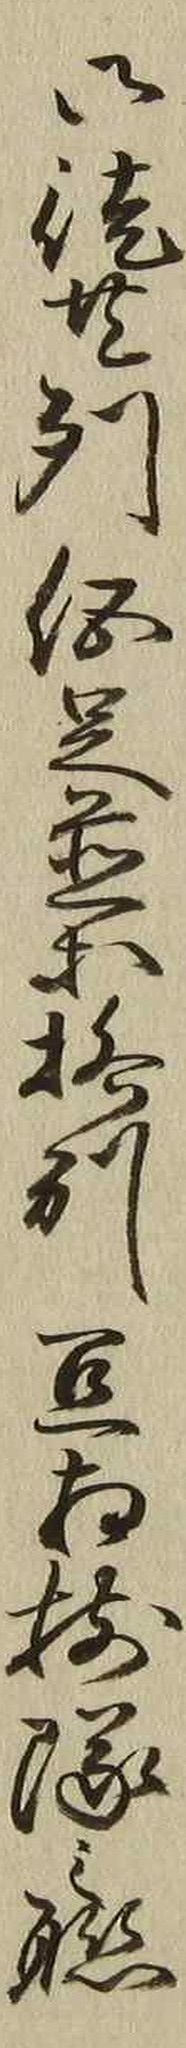御徒共列伍足並等格別宜相揃隊々聯
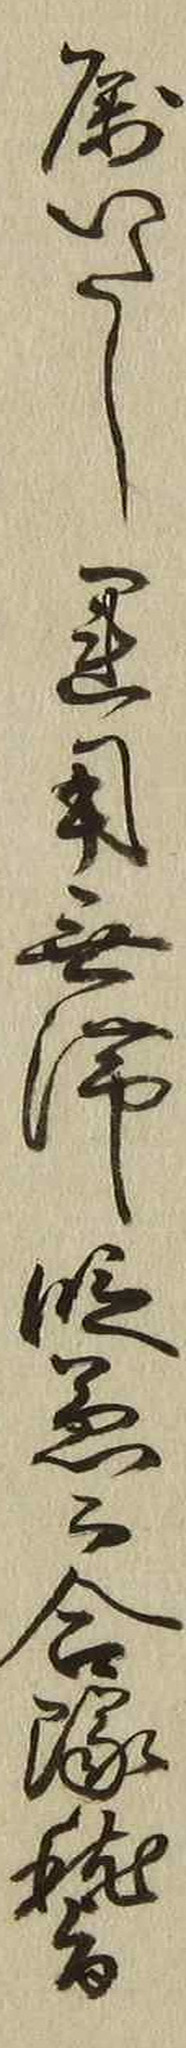属いたし運用無滞段兼而合隊稽
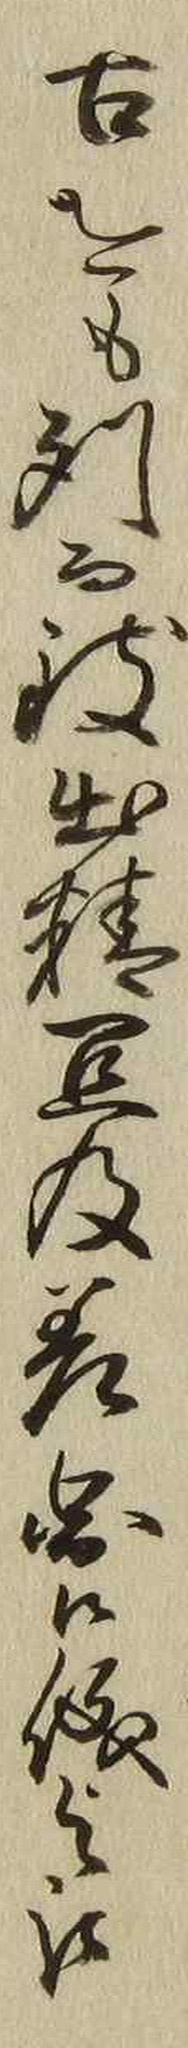古をも別而致出精宜及差図候儀与被
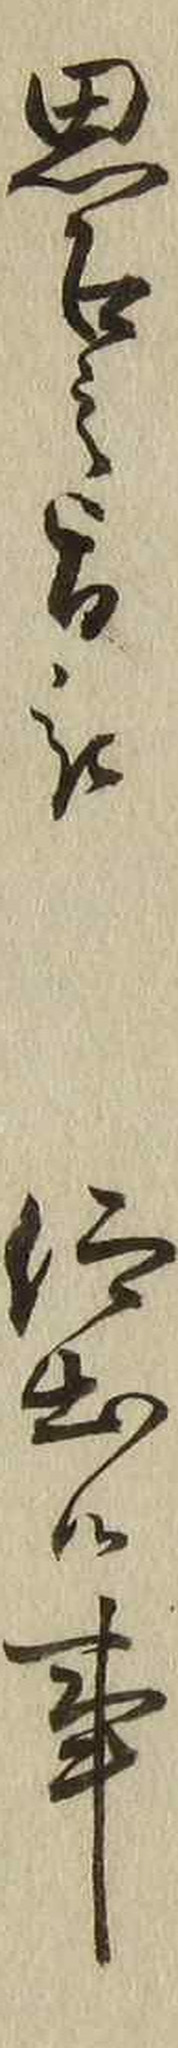思召之旨被仰出候事
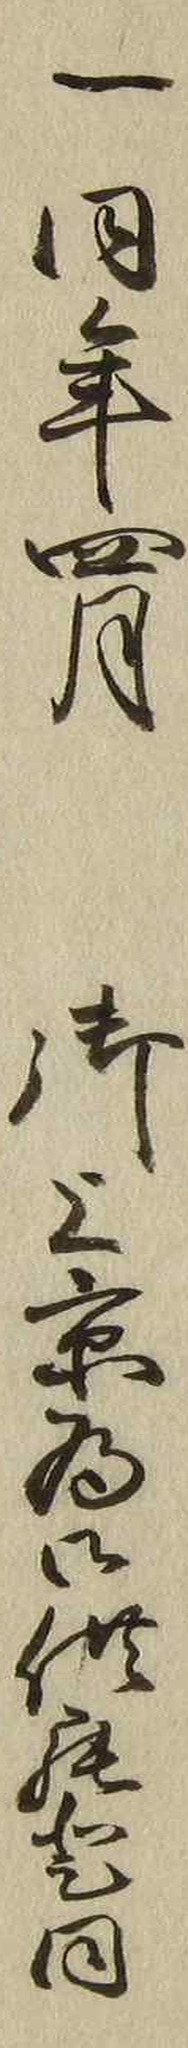一同年四月御上京為御供罷登同
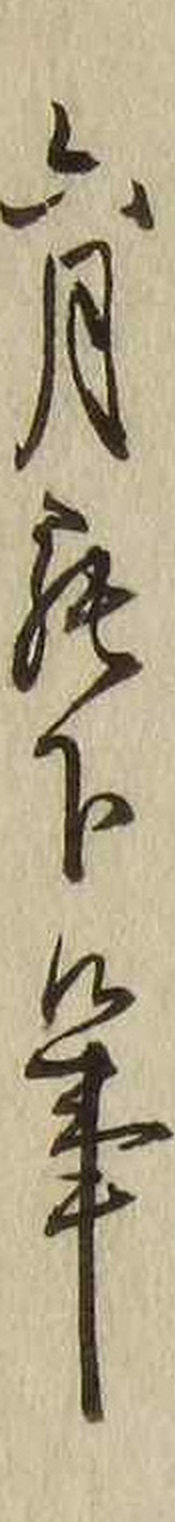六月罷下候事
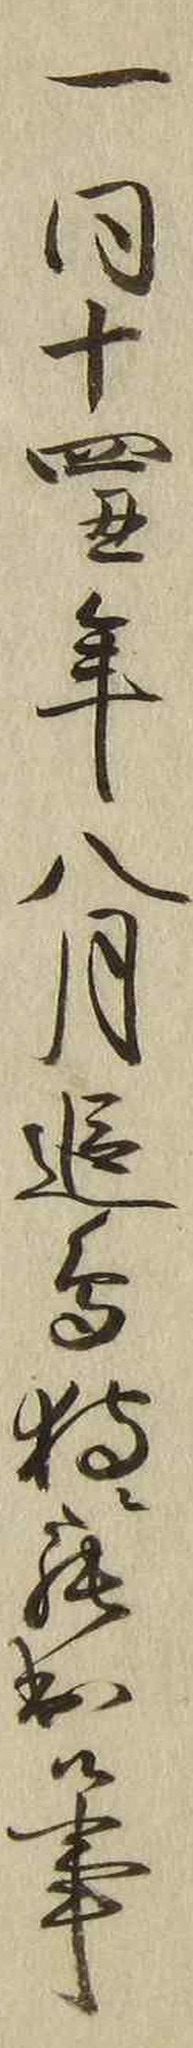一同十四丑年八月追鳥狩ニ罷出候事
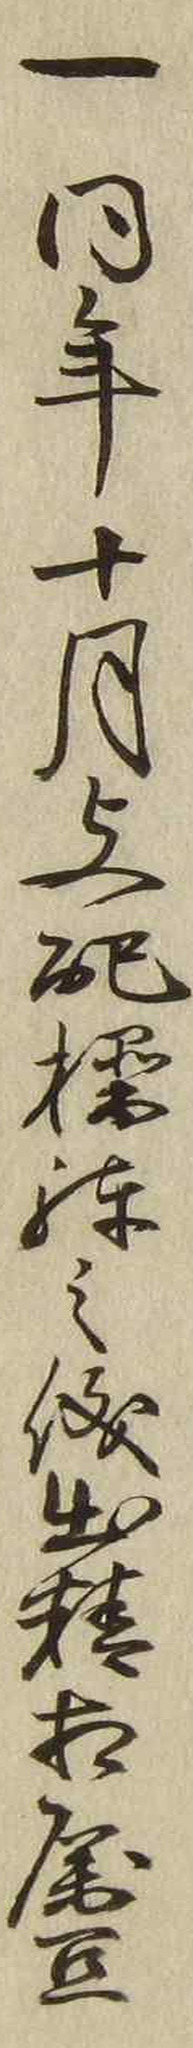一同年十月支配操練之儀出精相属宜

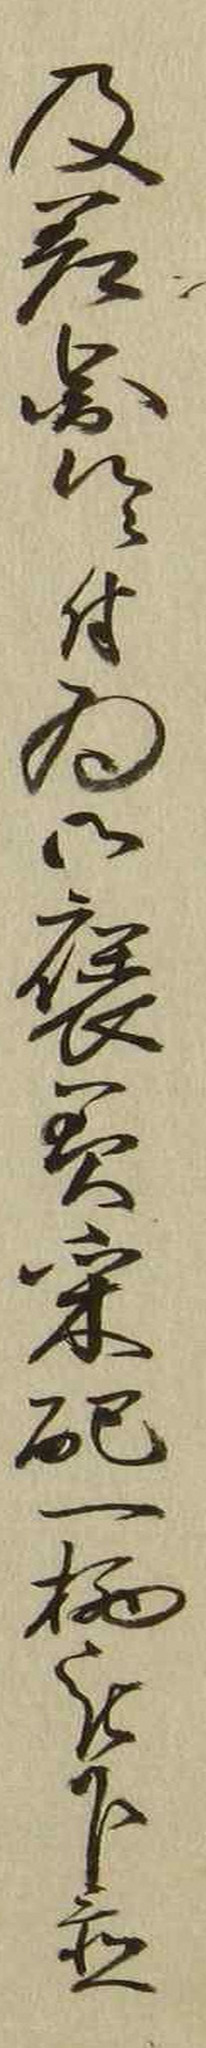及差図候ニ付為御褒美采配一柄被下置
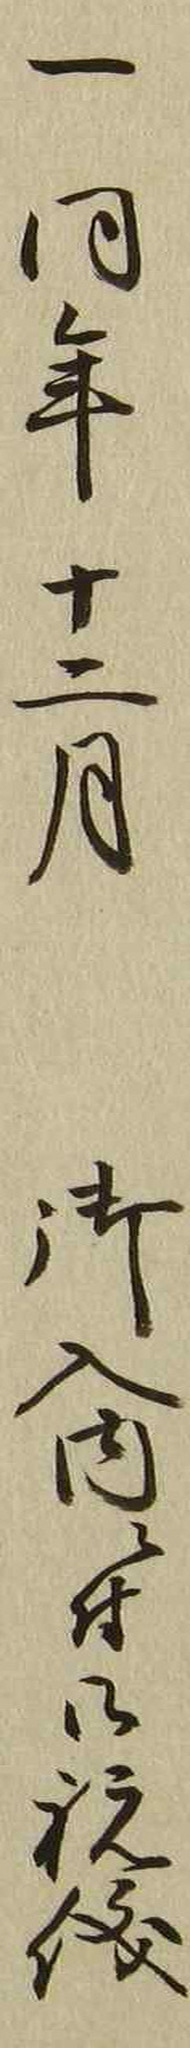一同年十二月御入内ニ付御祝儀
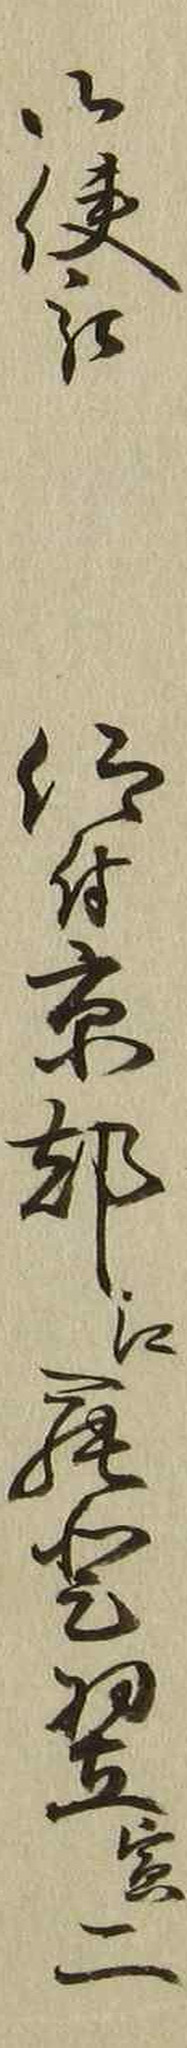御使被仰付京都江罷登翌寅二
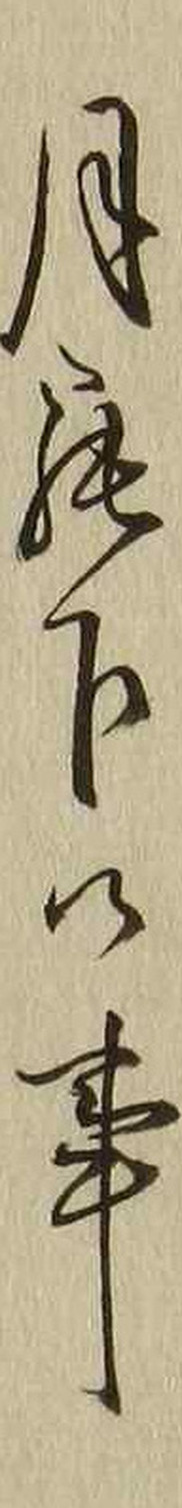月罷下候事
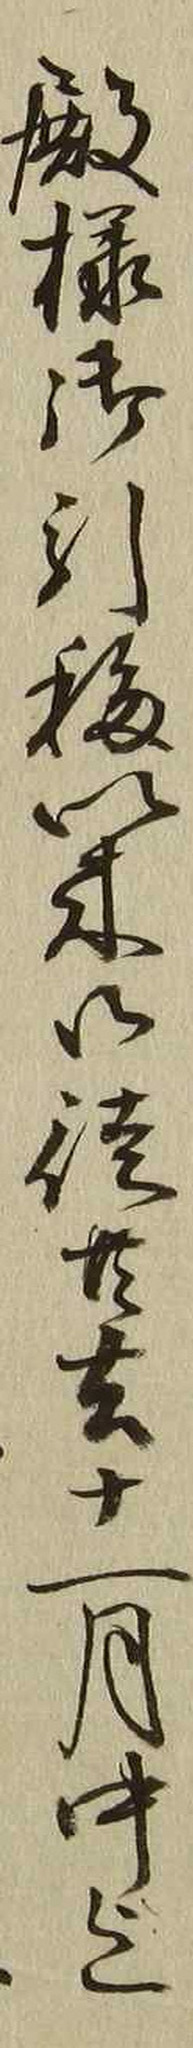殿様御引移以来御徒共去十一月中迄
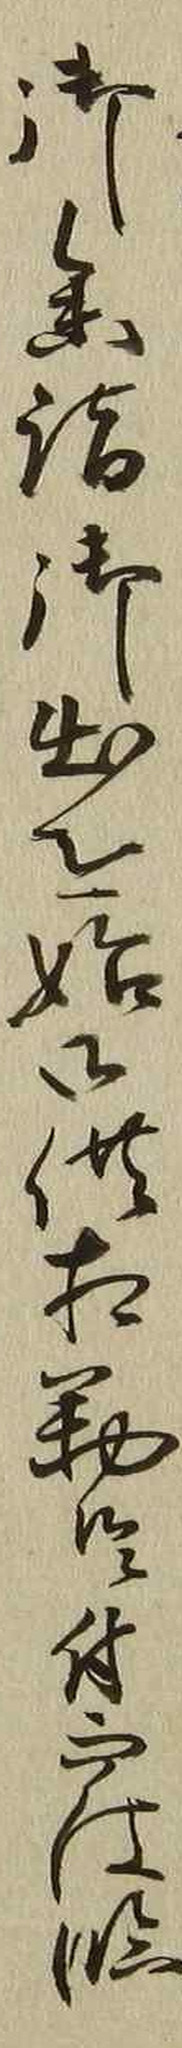御参詣御出世始御供相勤候ニ付而は臨
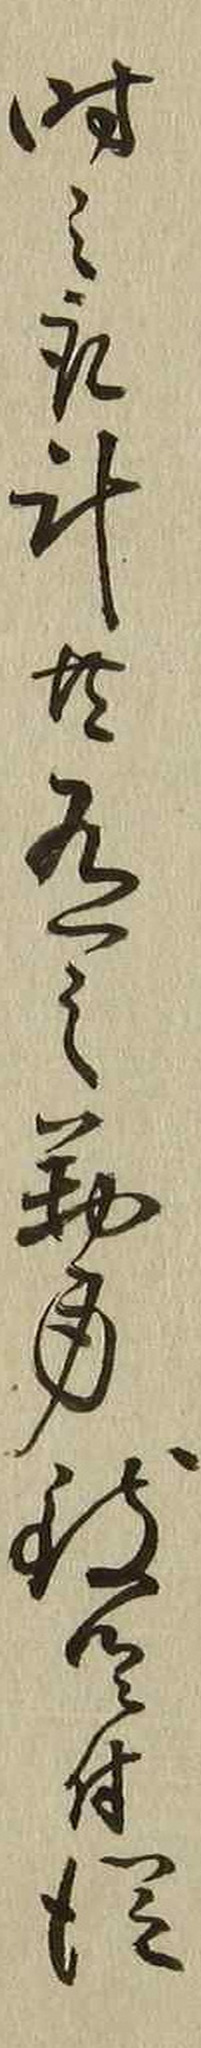時之取計共有之勤身致候ニ付従
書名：諸士系譜　巻之60　と之部3
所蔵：会津若松市立会津図書館
